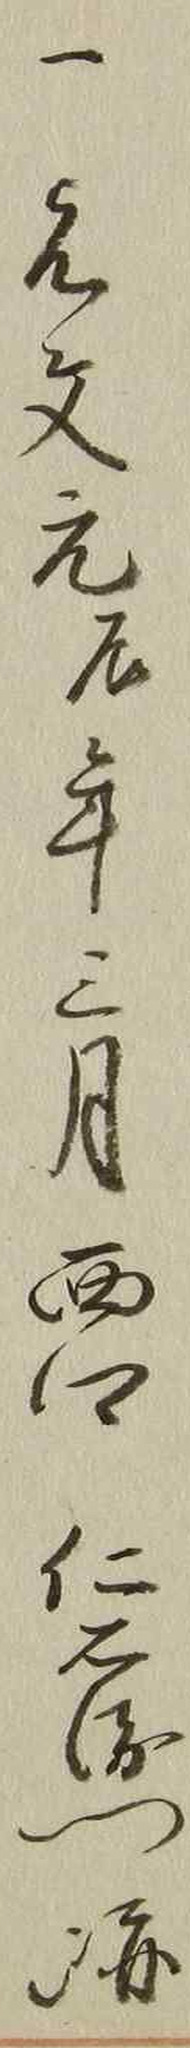一元文元辰年三月西郷仁右衛門跡
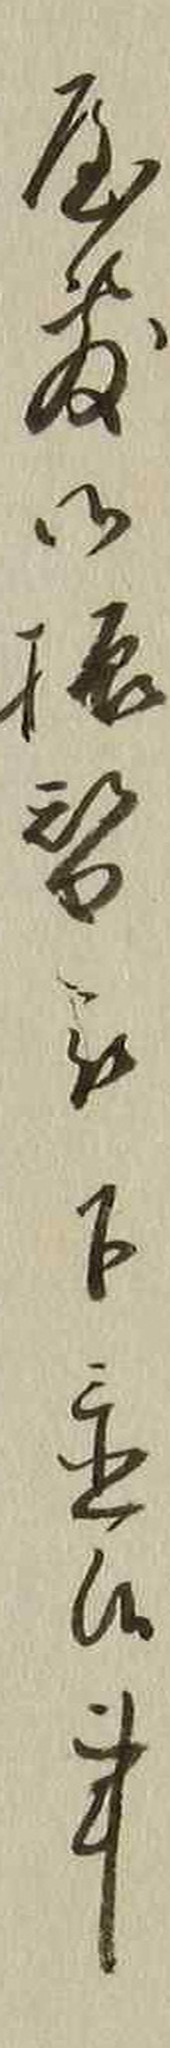屋敷御振替被下置候事
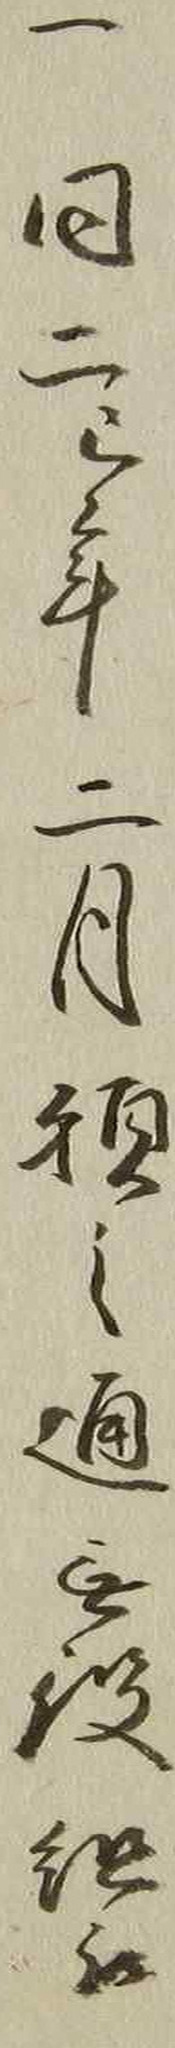一同二巳年二月願之通無役組被
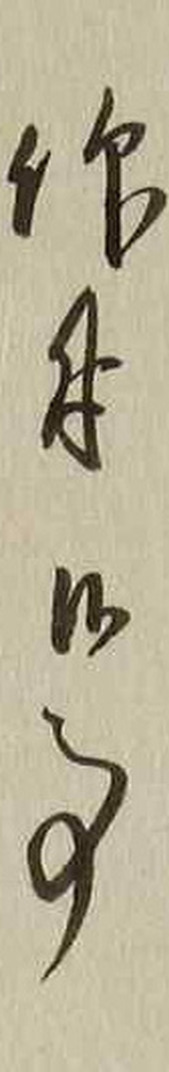仰付候事
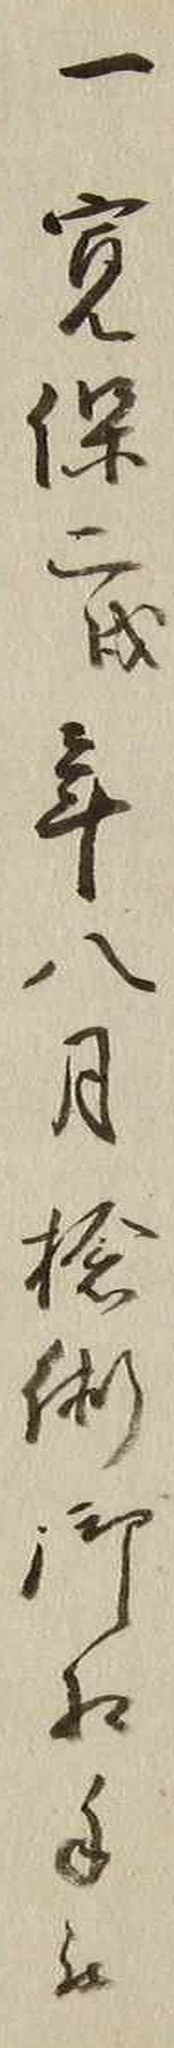一寛保二戌年八月槍術御相手被
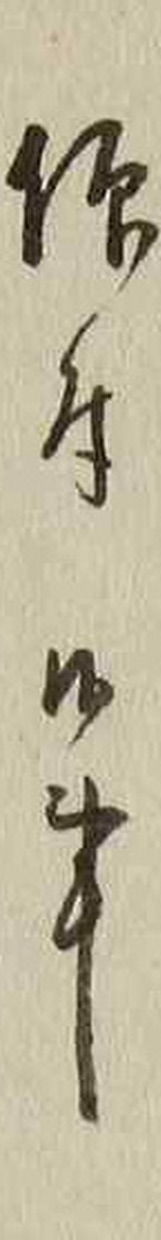仰付候事
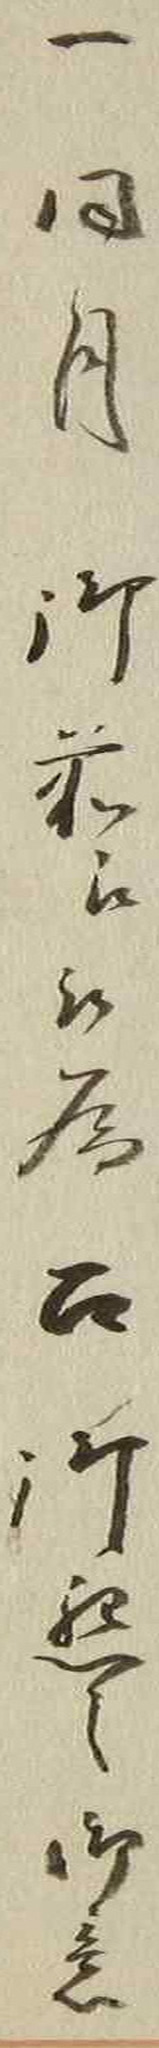一同月御前江被為召御懇之御意
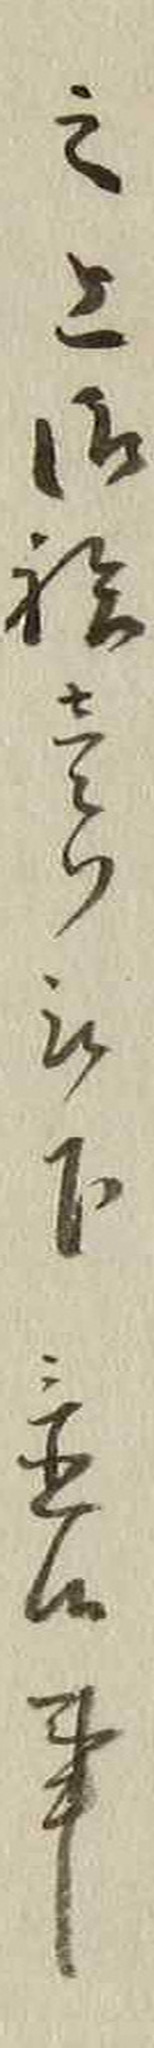之上御袷壱ツ被下置候事
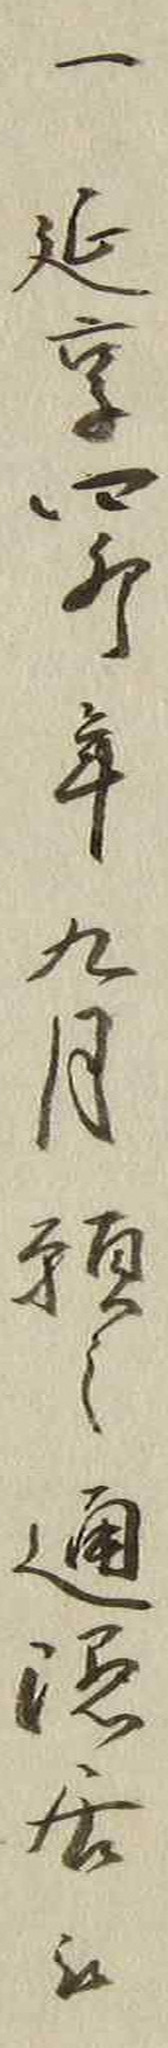一延享四卯年九月願之通隠居被
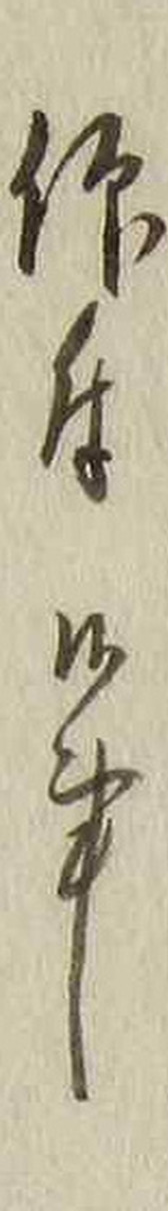仰付候事
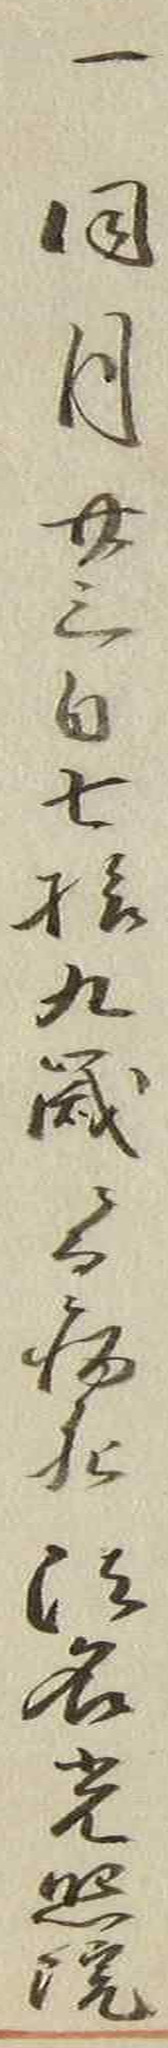一同月廿三日七拾九歳ニ而病死法名光照院
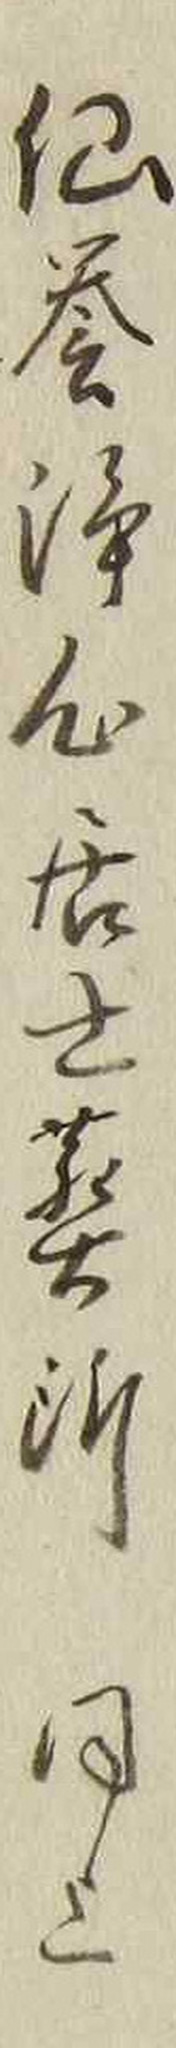仙誉浄心居士葬所同上

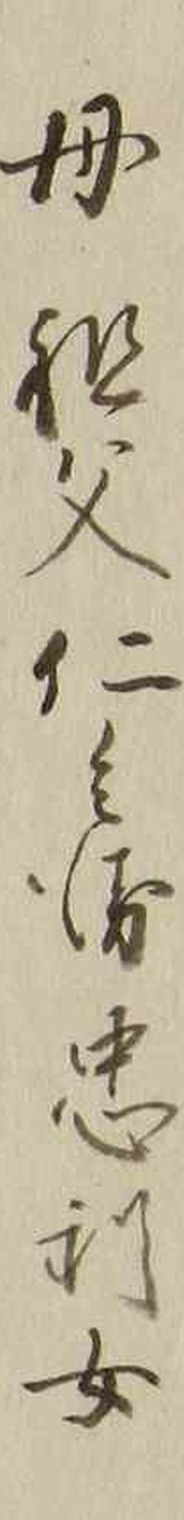母祖父仁兵衛忠利女
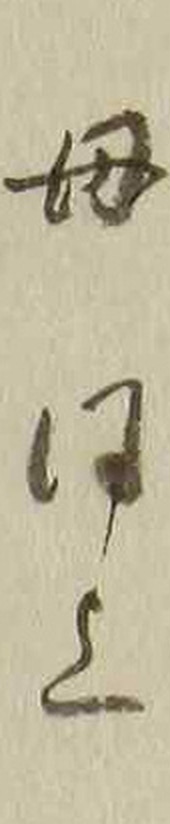母同上
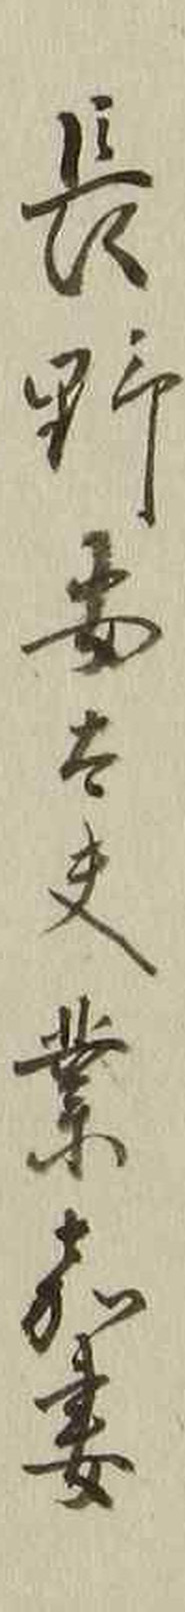女長野安太夫業嘉妻
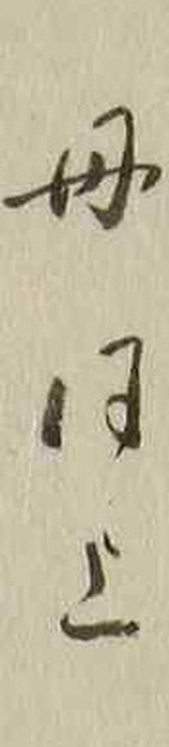母同上
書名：諸士系譜　巻之122　よ之部5
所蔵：会津若松市立会津図書館
